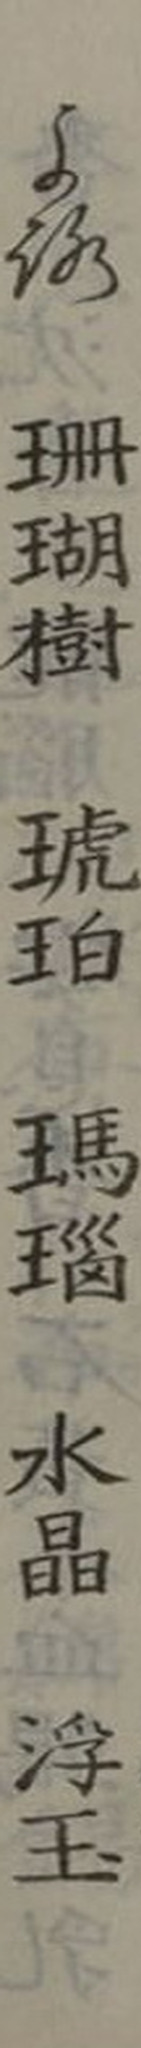よろ珊瑚樹琥珀瑪瑙水晶浮玉
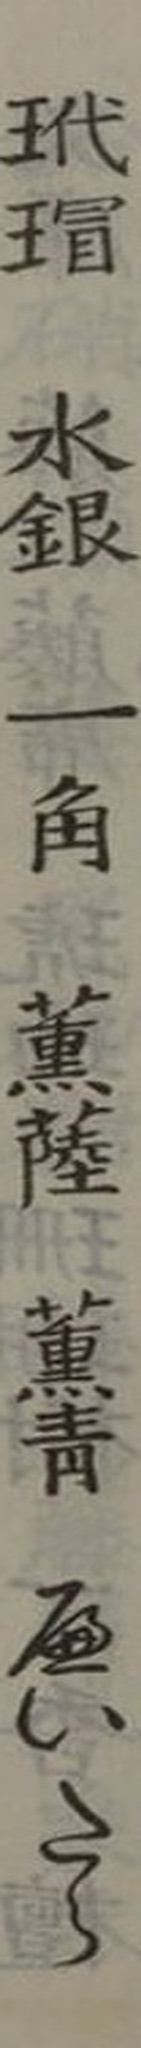玳瑁水銀一角薫薫青へいたら
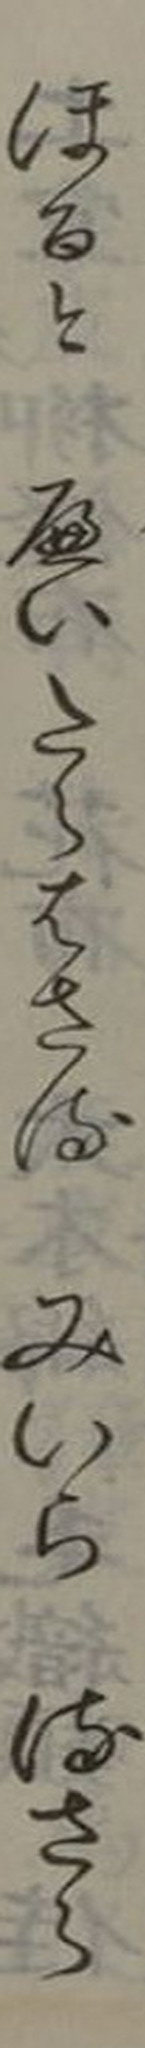ほるとへいてらはさるみいらるさら
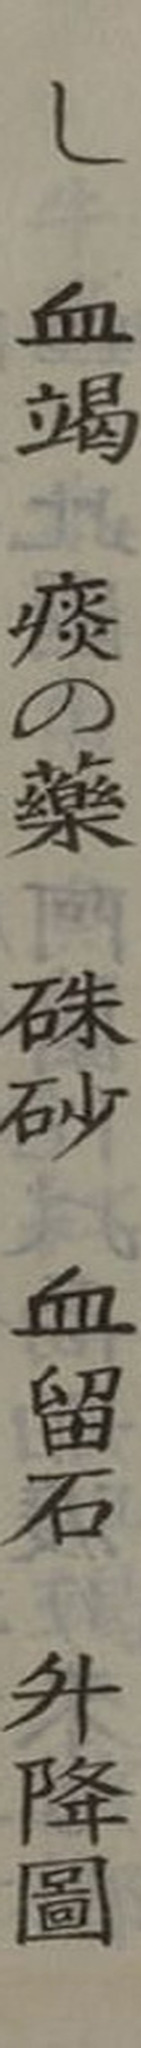し血竭痰の藥殊砂血留石外降圖
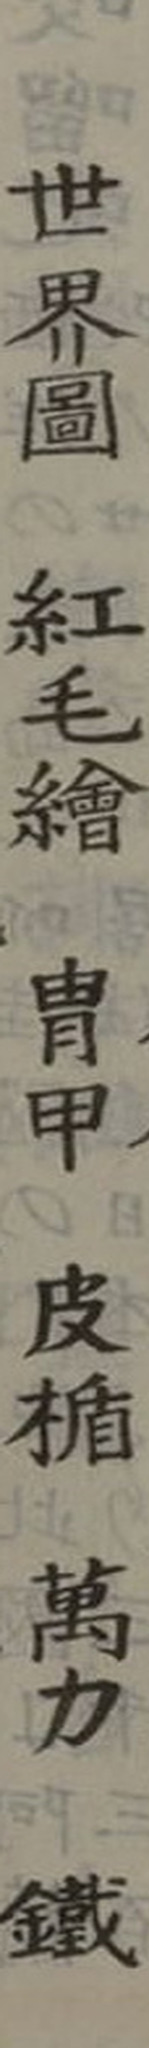世界圖紅毛繪胃甲皮楯萬力鐵
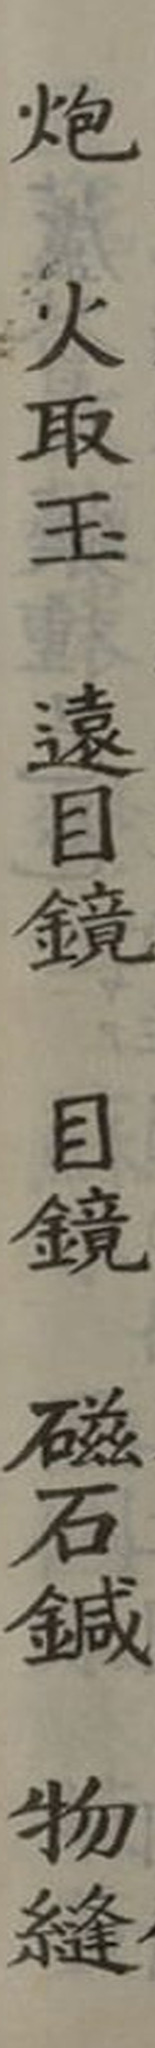炮火取玉遠目鏡目鏡磁石鍼物縫
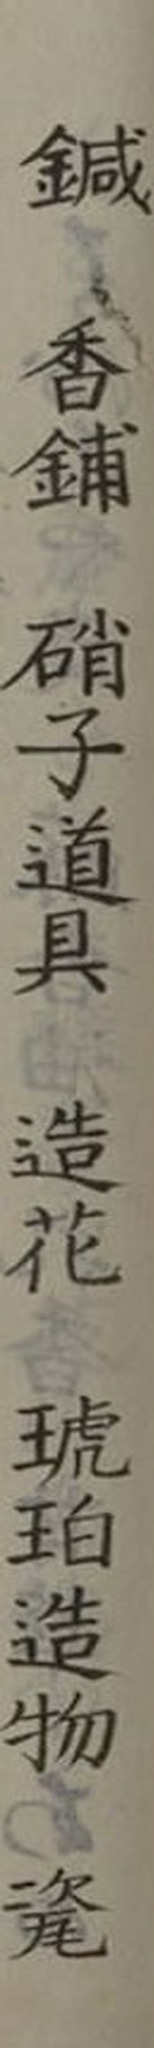鍼香鋪硝子道具造花琥珀造物
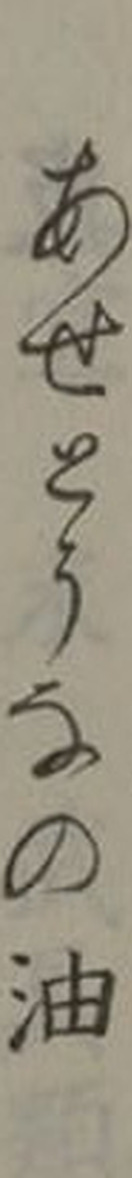あせとうなの油
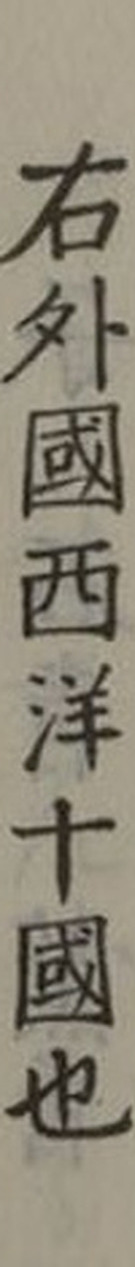右外國西洋十國也
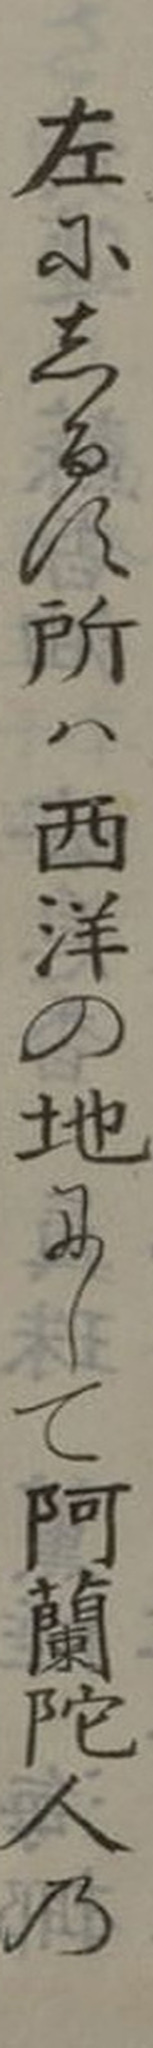左にしるす所は西洋の地にして阿蘭陀人の
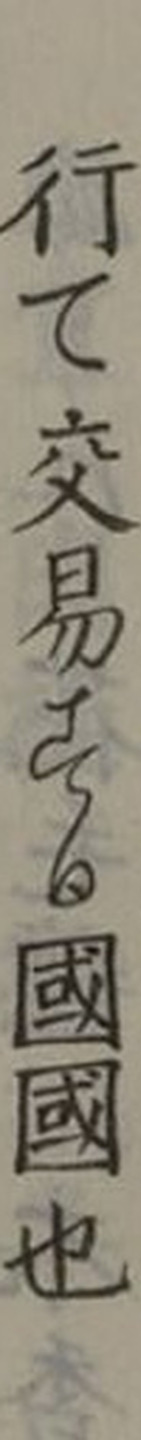行て交易する國國也
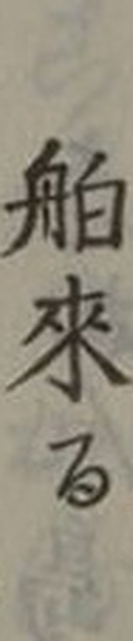舶來る
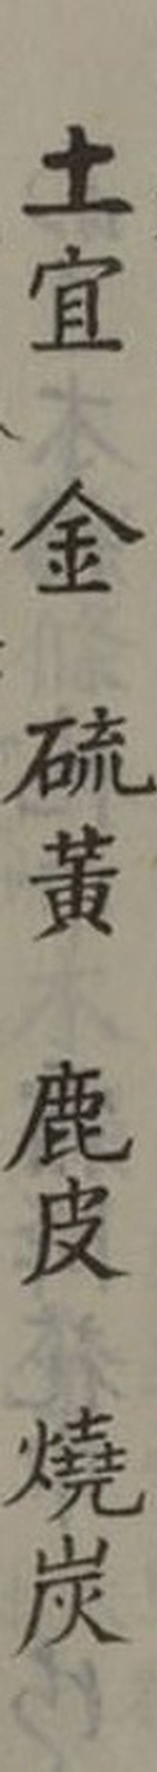土宜金硫黃鹿皮燒炭
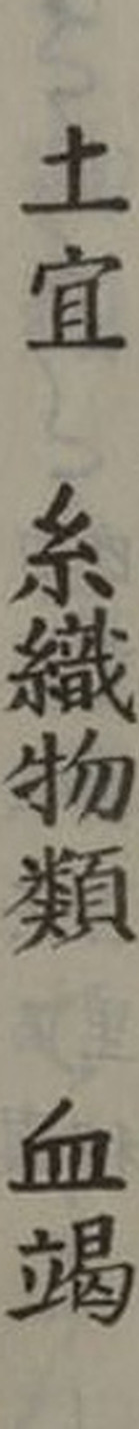土宜糸織物類血竭

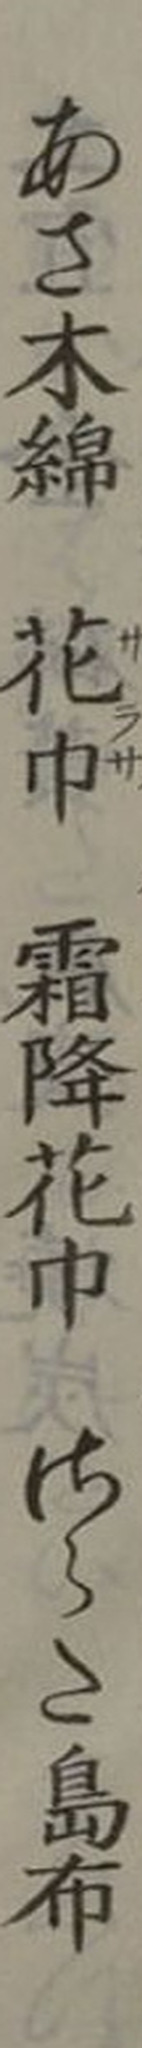あさ木綿花巾霜降花巾さらた島布
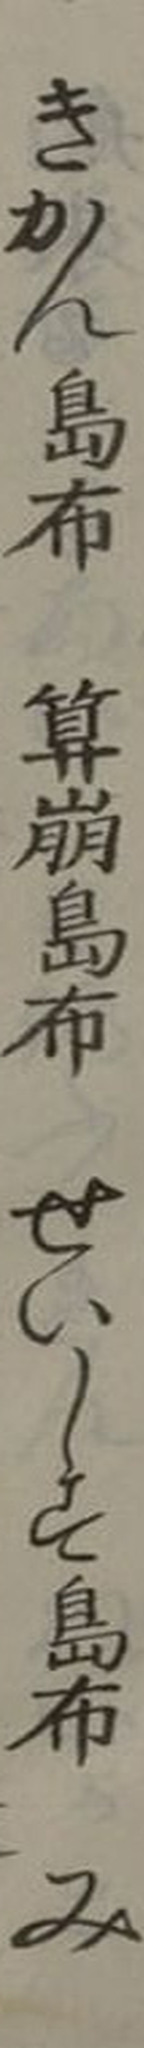きかん島布算崩島布せいしす島布み
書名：骨董録
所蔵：University of the Ryukyus Library
